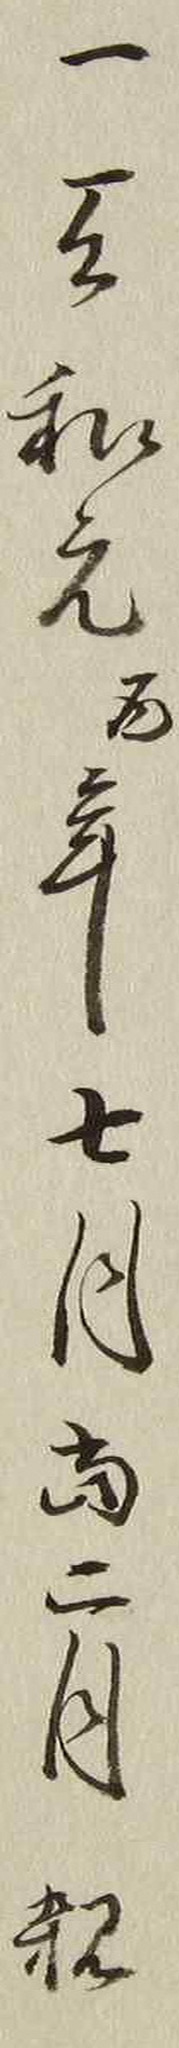一天和元酉年七月当二月親
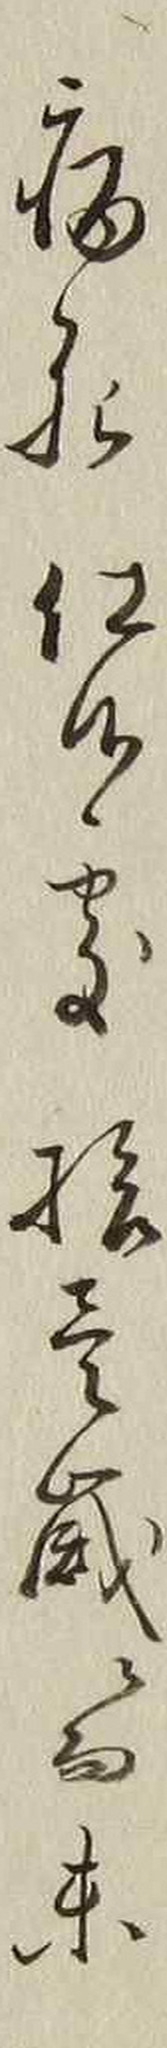病死仕候処拾壱歳に而未
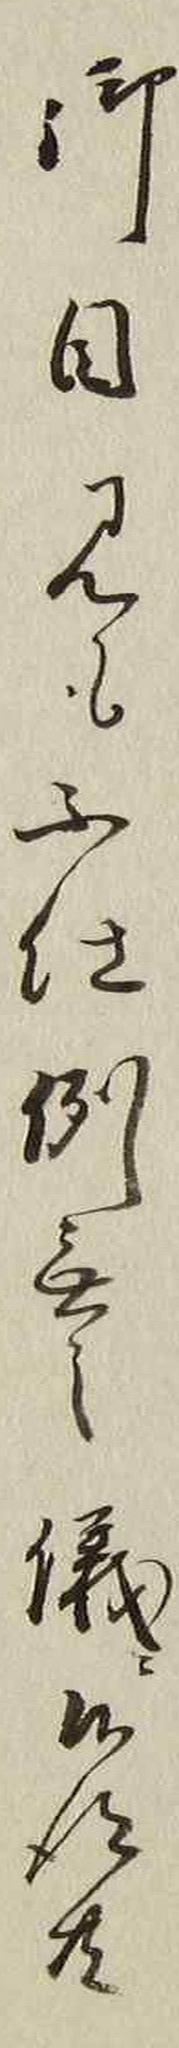御目見も不仕例無之儀に候得共
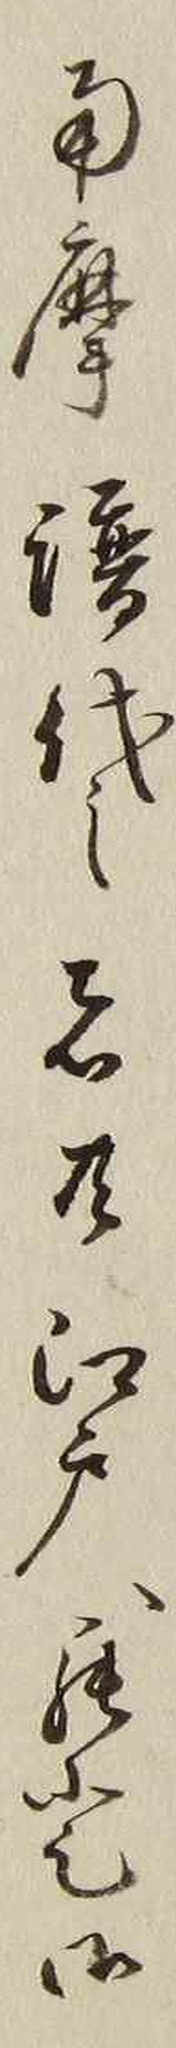南摩譜代之者共江戸へ罷登御
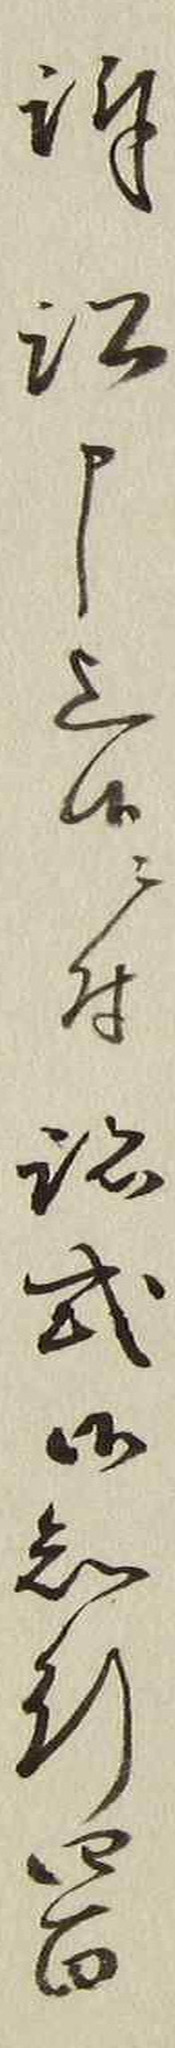訴訟申上候に付跡式御知行四百
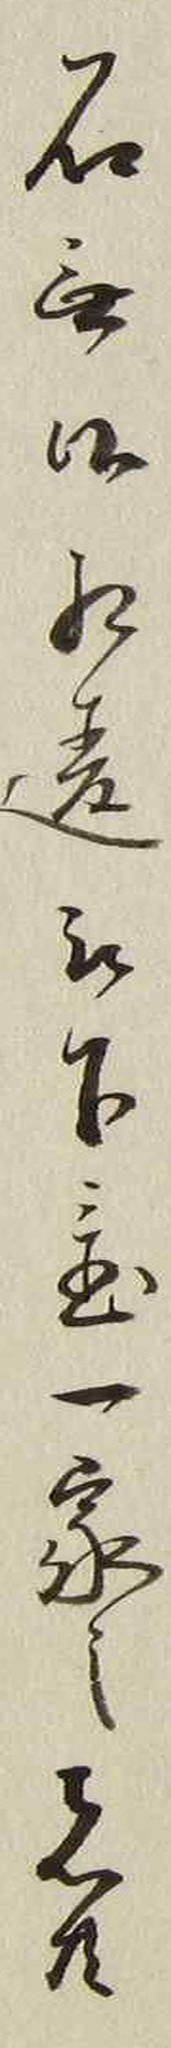石無御相違被下置一家之者共
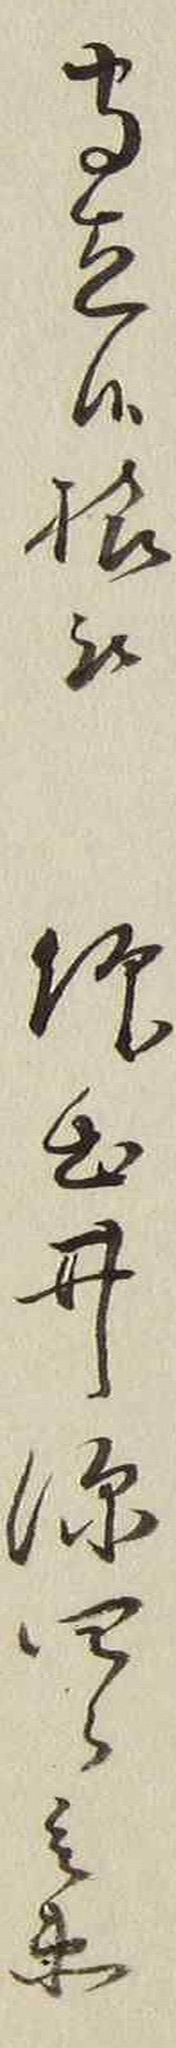守立候様被仰出井深四郎兵衛
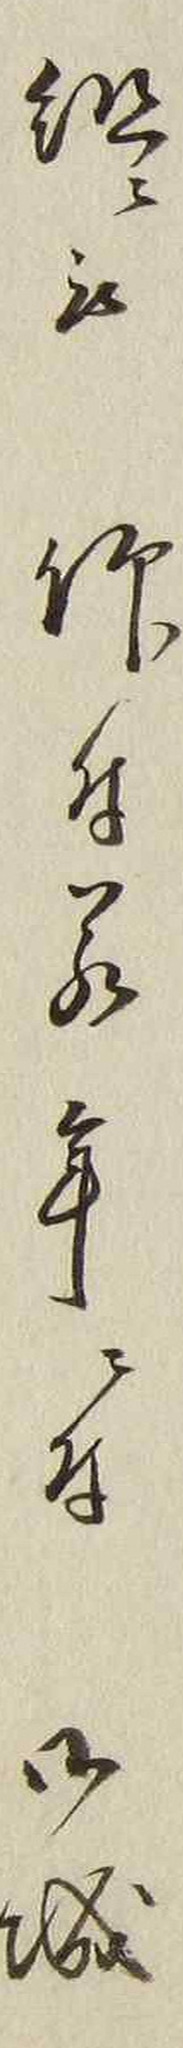組に被仰付若年に付御城

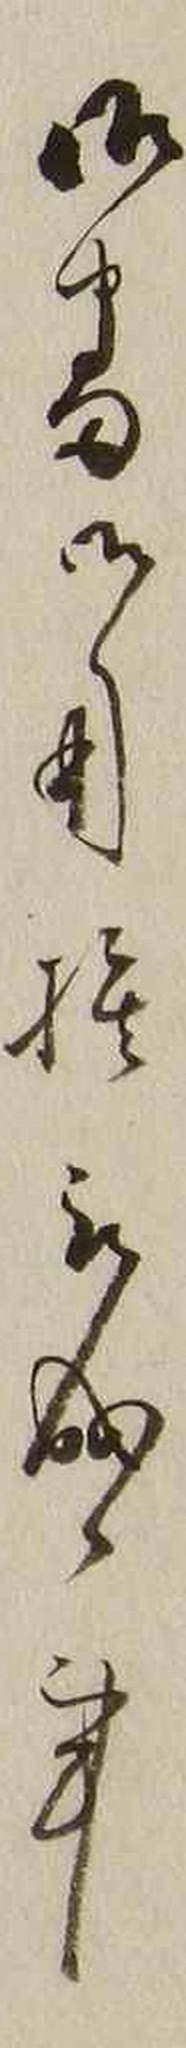御番御用捨被成候事
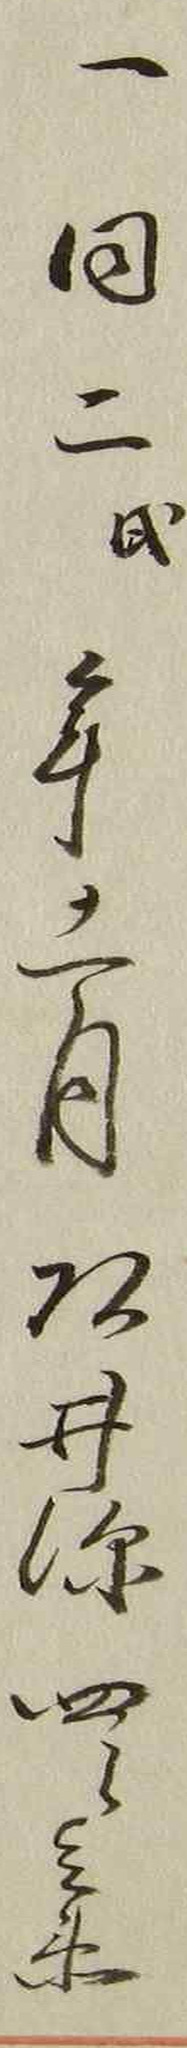一同二戌年十一月頭井深四郎兵衛
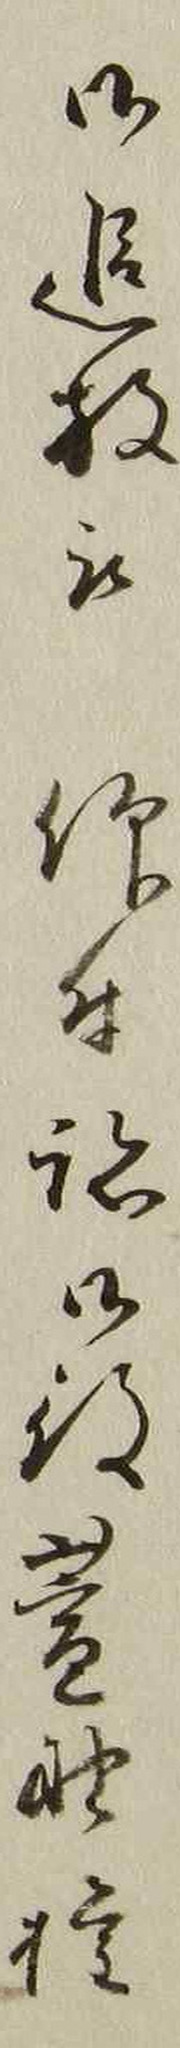御退役被仰付跡御役萱野権
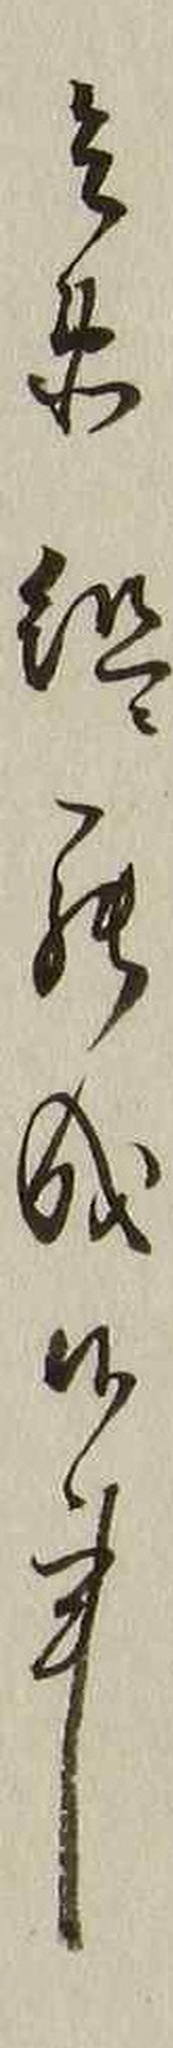兵衛組に罷成候事
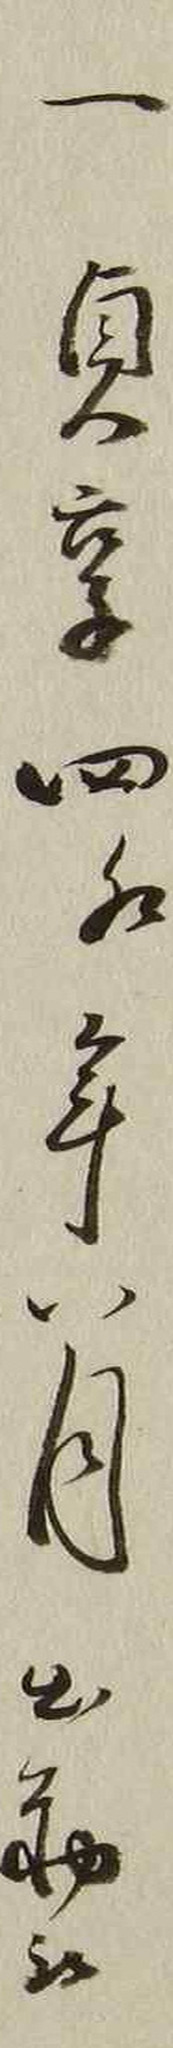一貞享四卯年八月出勤被
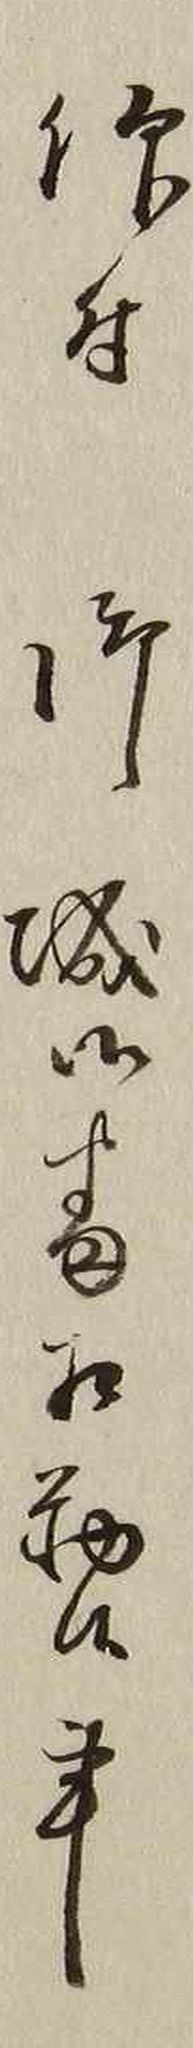仰付御城御番相勤候事
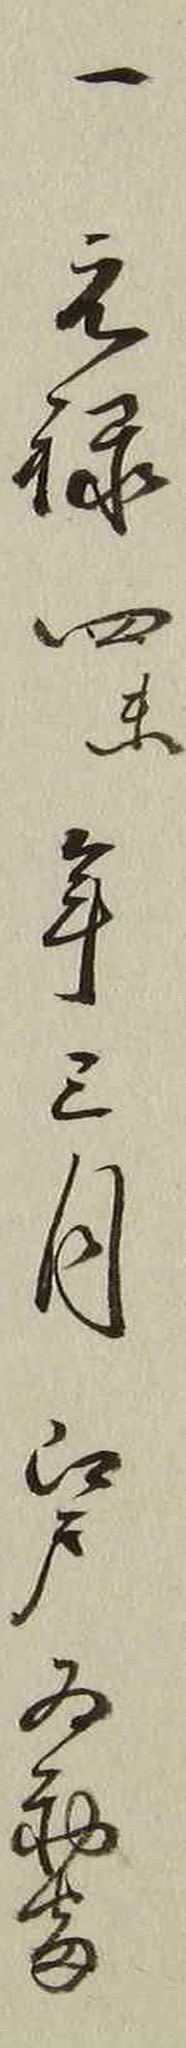一元禄四未年三月江戸為勤番
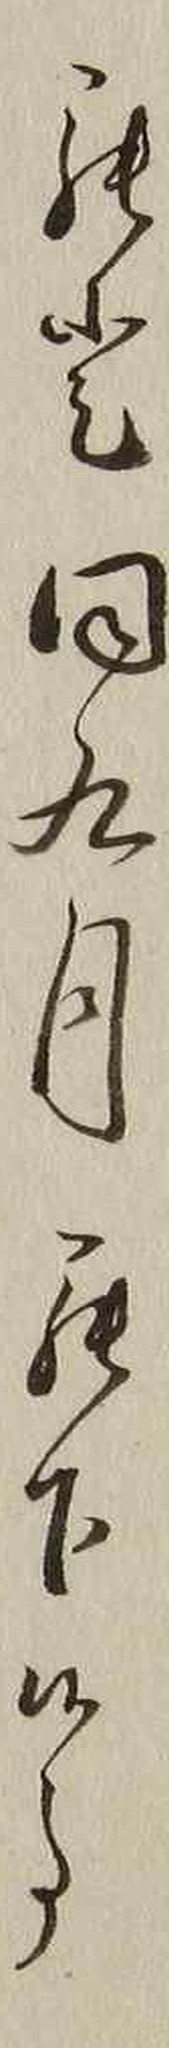罷登同九月罷下候事
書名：諸士系譜　巻之159　な之部1
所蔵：会津若松市立会津図書館
